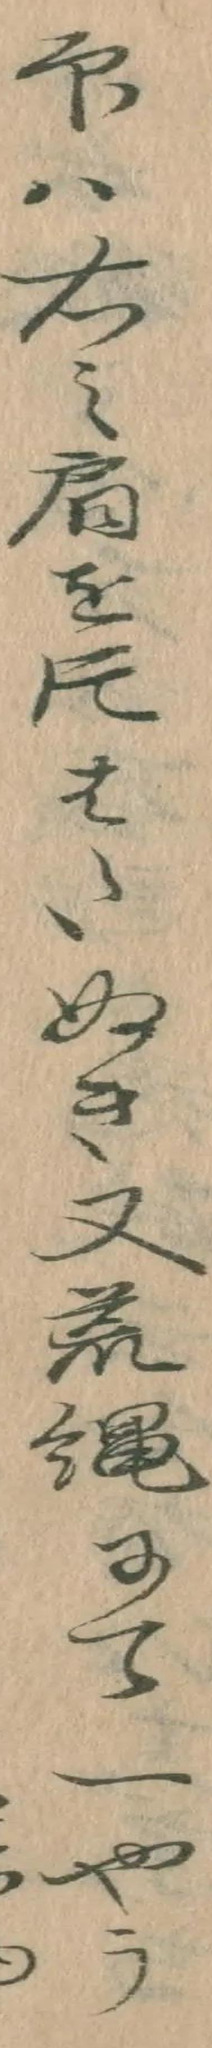印は右之肩を片はたぬき又荒縄尓て一やう
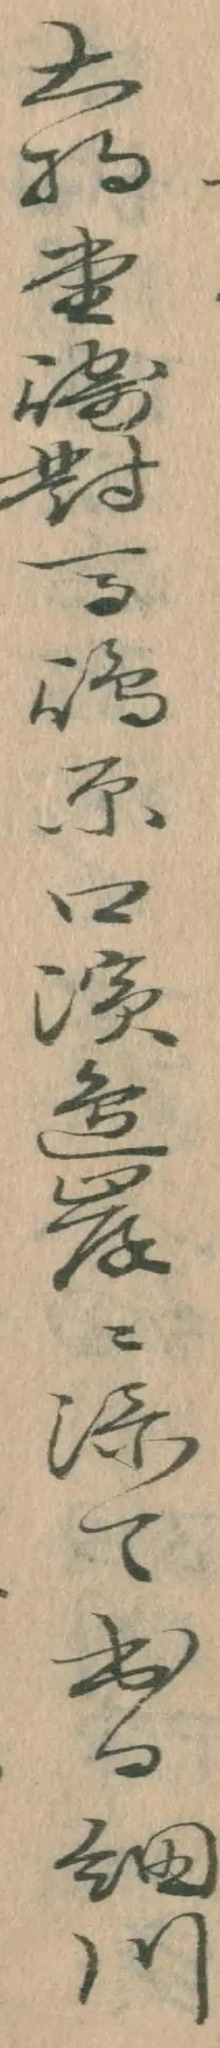大将野崎対馬島原口浜辺岸に添て出る細川
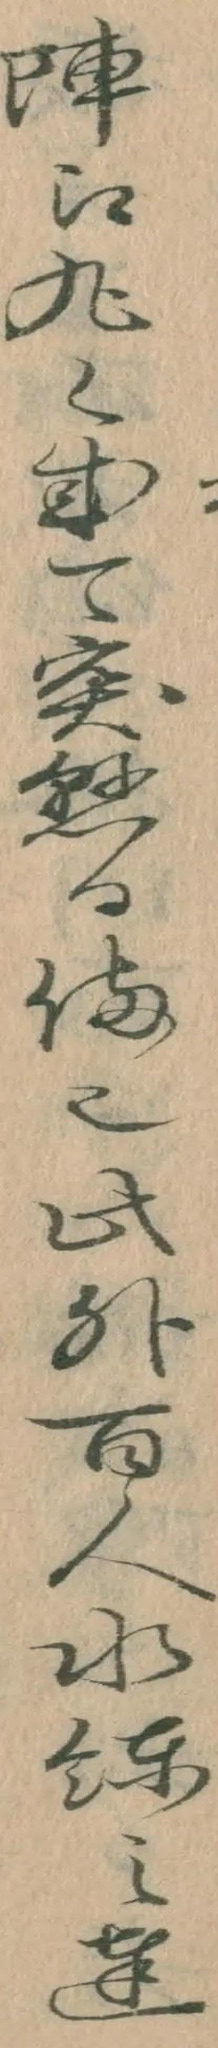陣江丸く成て突懸る備也此外百人水練之達
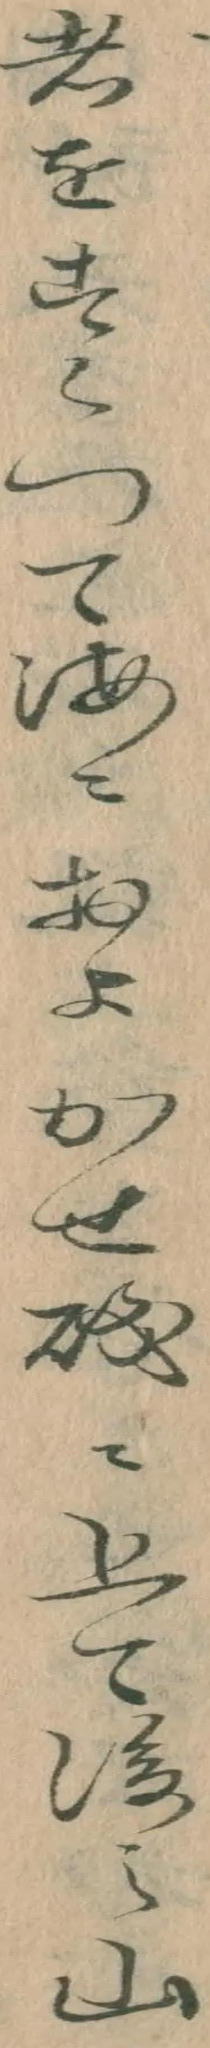者を春くつて海におよかせ磯に上て後之山
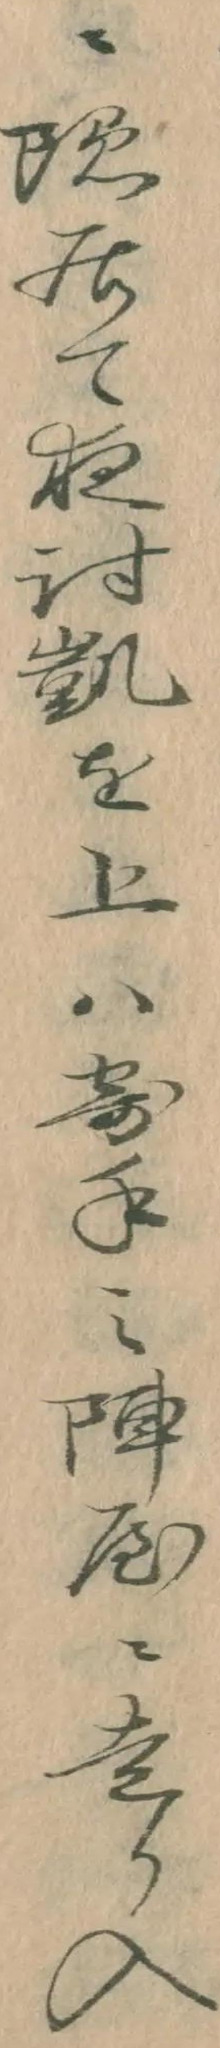に隠居て夜討凱を上は寄手之陣屋に走り入

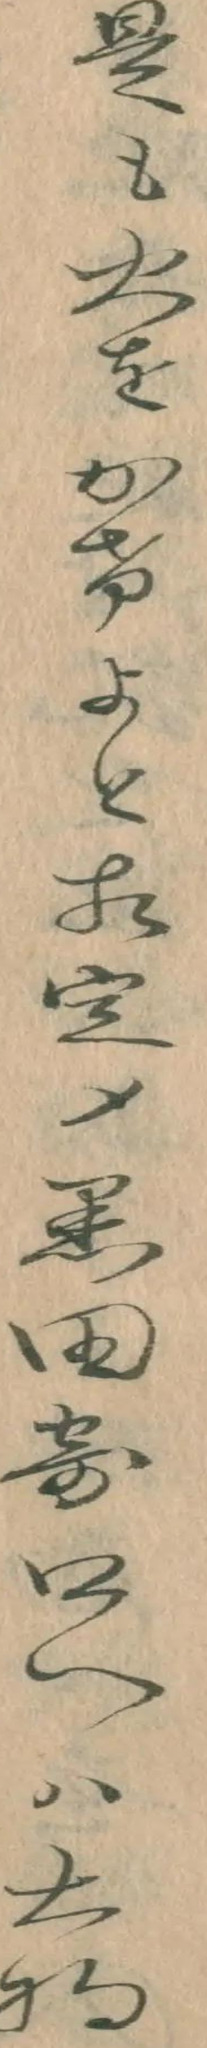是も火をか希よと相定め黒田寄口へは大将
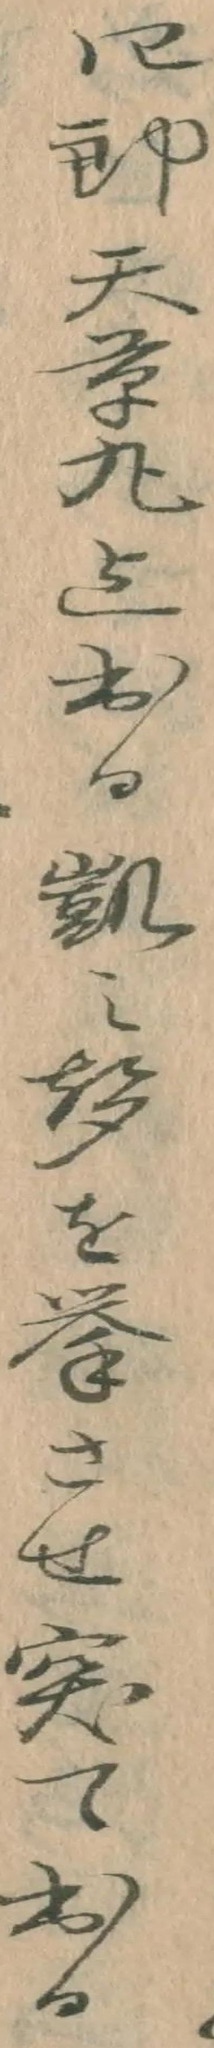四郎天草丸迄出る凱之声を挙させ突て出る
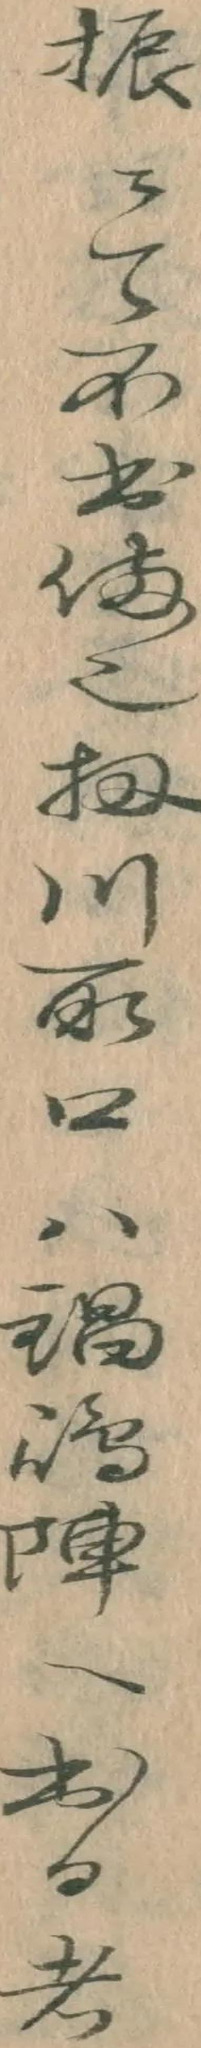振にて不出備也扨川取口は鍋島陣へ出る者
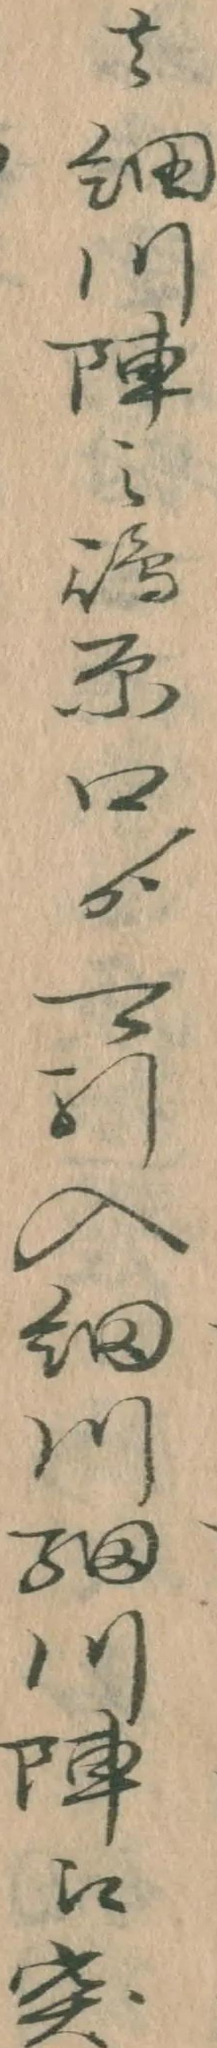者細川陣之島原口ゟ可引入細川細川陣江突
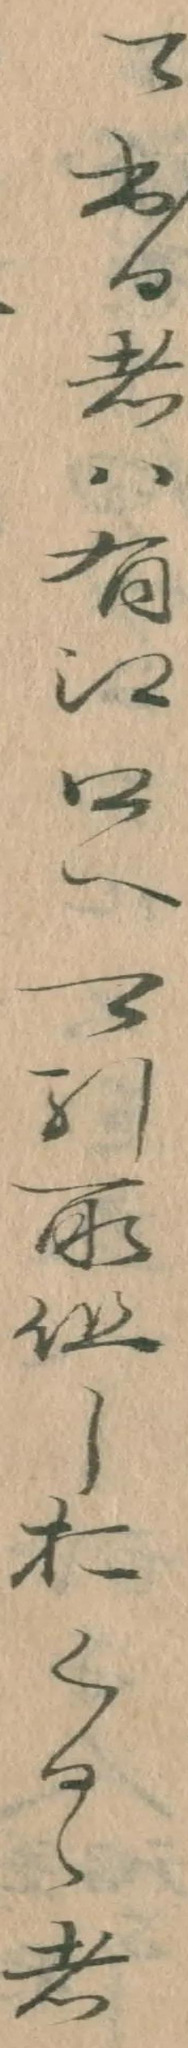て出る者は有江口へ可引取但し於くるゝ者
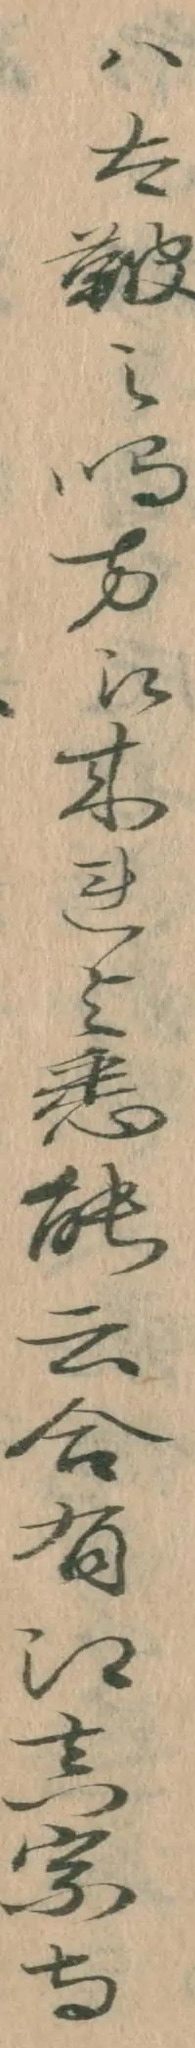は太皷之鳴方江来連与悉能云合有江真宗寺
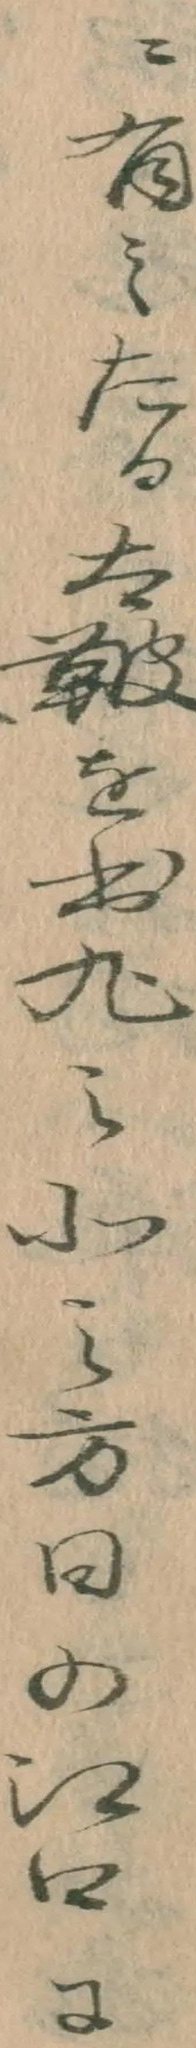に有之たる太皷を出丸之北之方日の江口尓
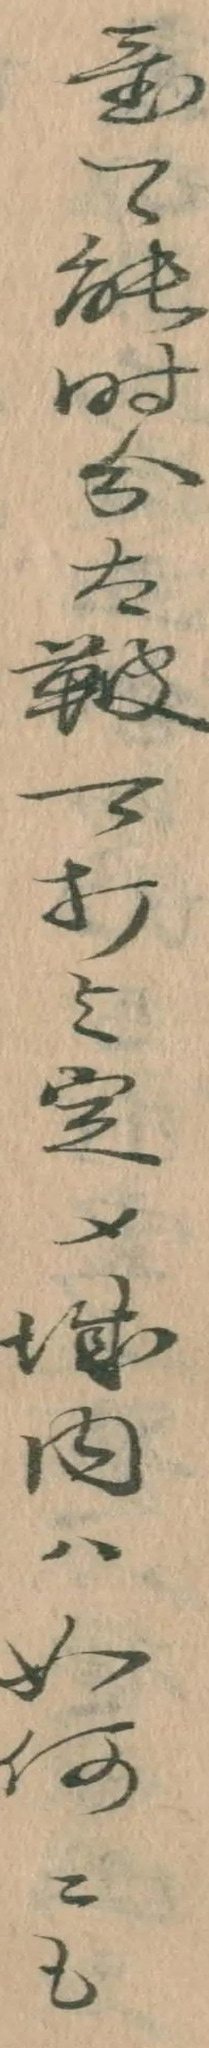置て能時分太皷可打与定め城内は如何にも
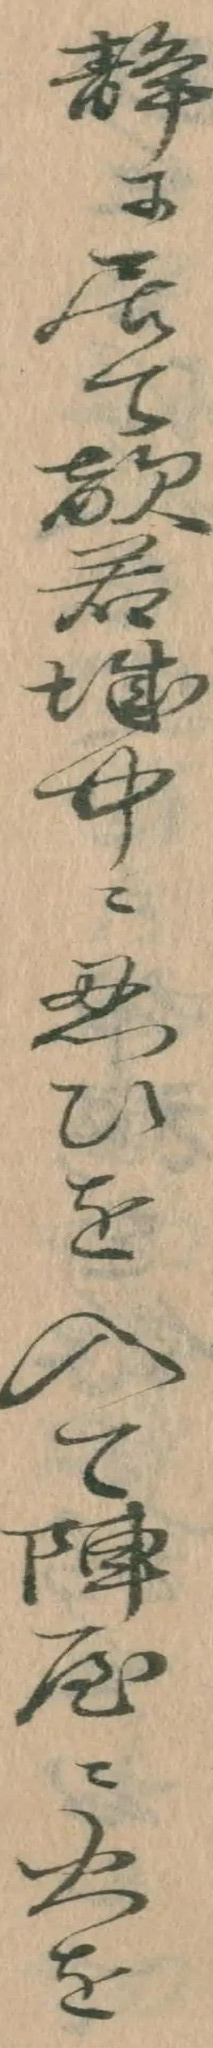静尓居て敵若城中に忍ひを入て陣屋に火を
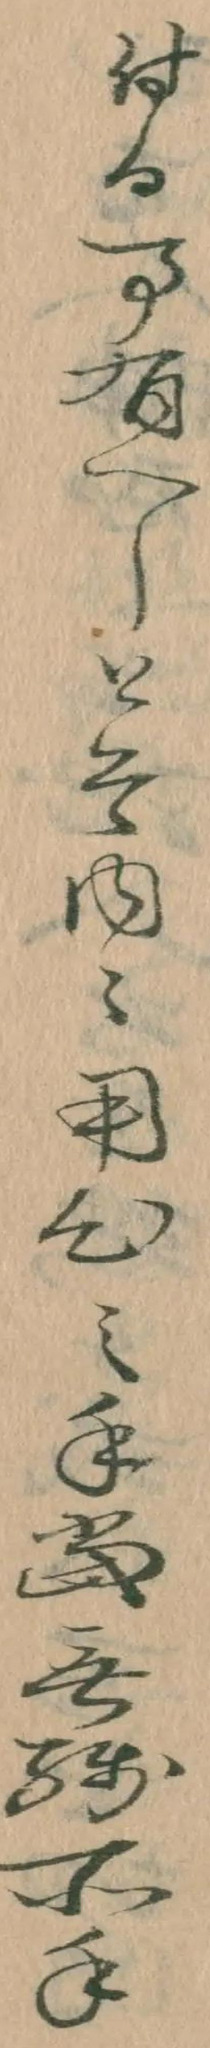付る事有へしとそ内々用心之手当無残所手
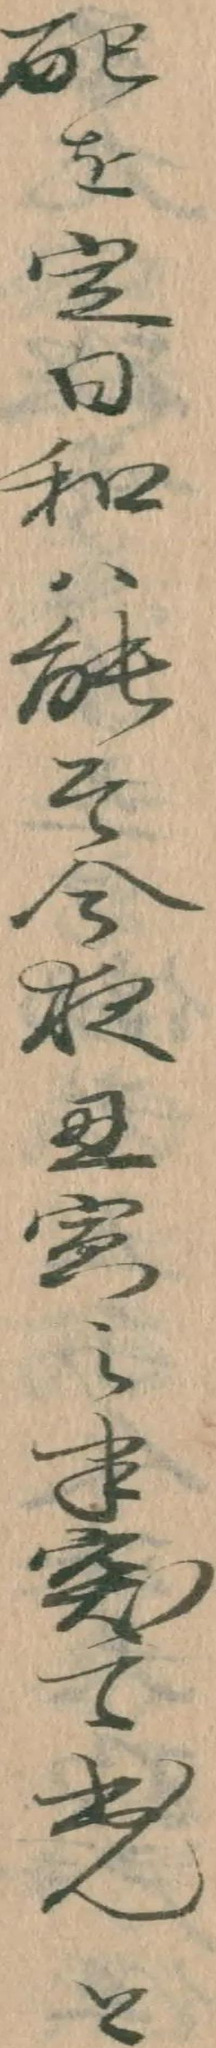配を定日和は能そ今夜丑寅之半突て出んと
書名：切支丹御退治記 49巻. [7]
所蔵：国立国会図書館 National Diet Library, JAPAN
